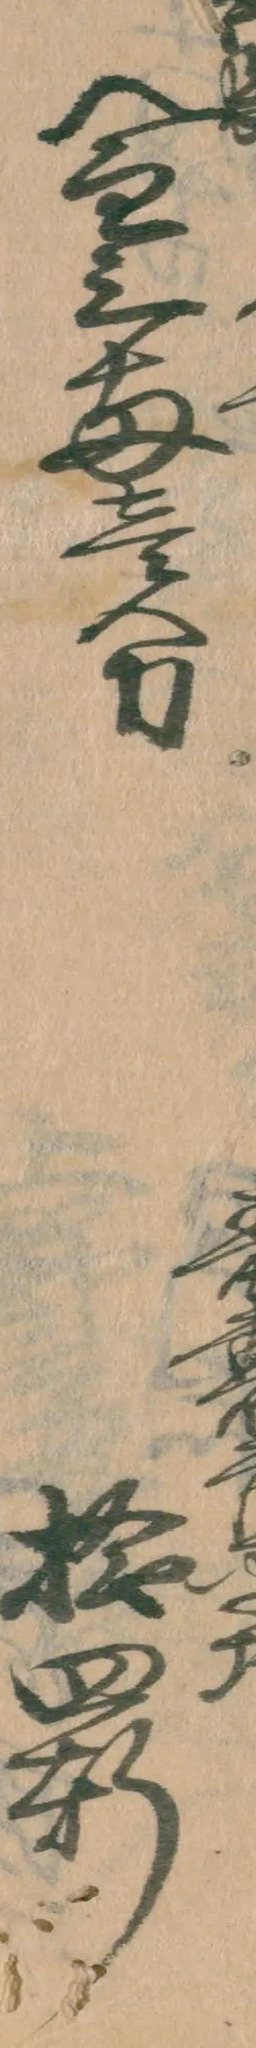一金三両壱分拾四軒
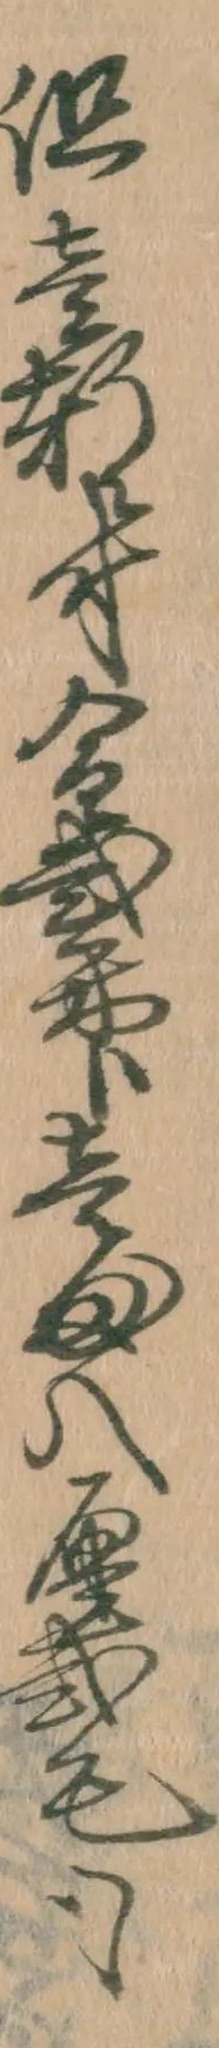但壱軒ニ付金弐朱ト壱匁八厘弐毛ツヽ
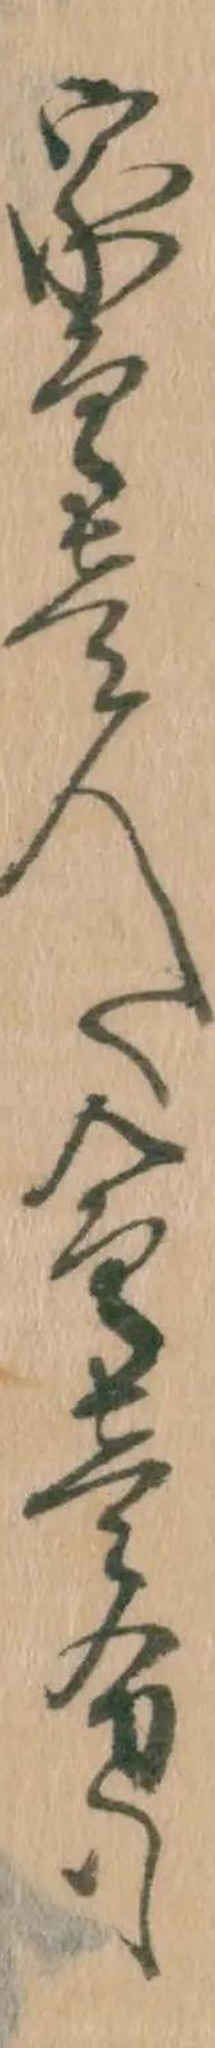家主壱人へ金壱分ツヽ
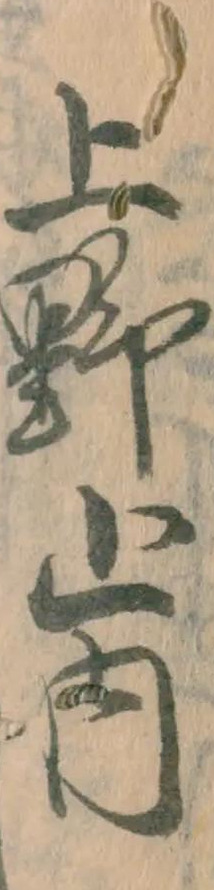上野山内
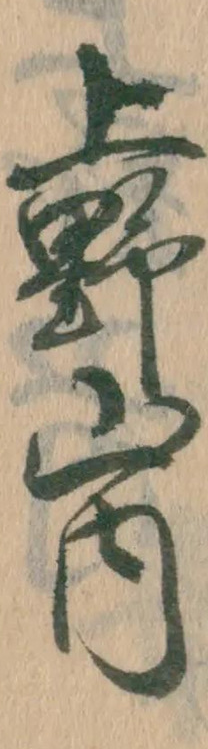上野山内
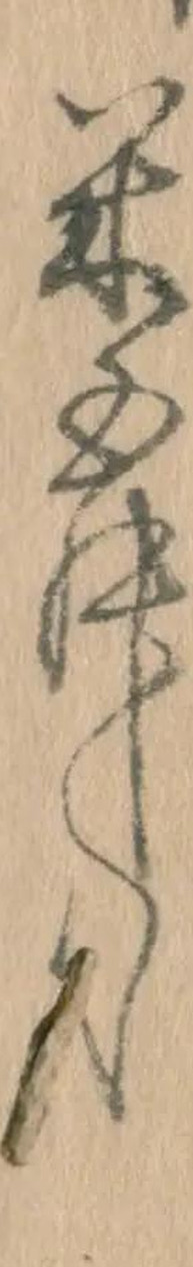米五升ツヽ

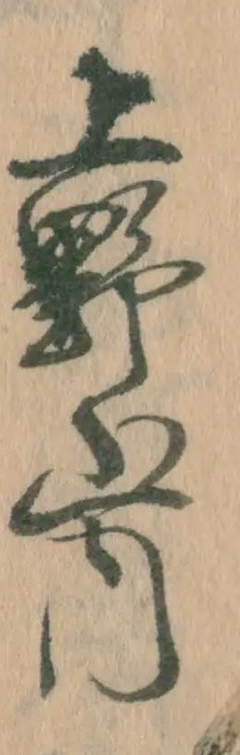上野山内
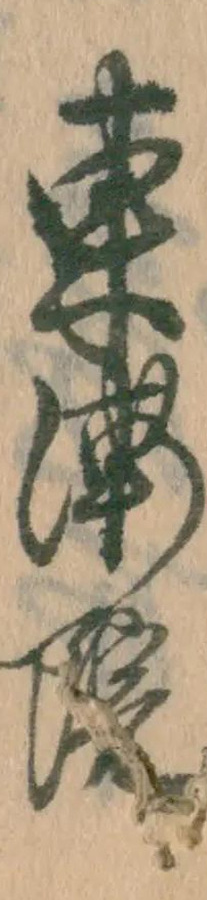東漸院
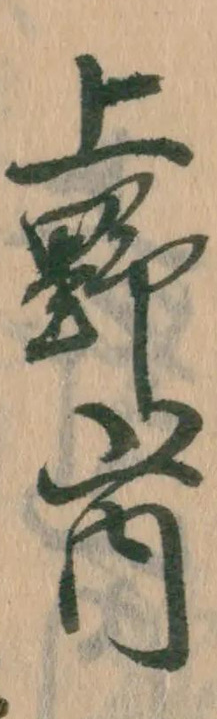上野山内
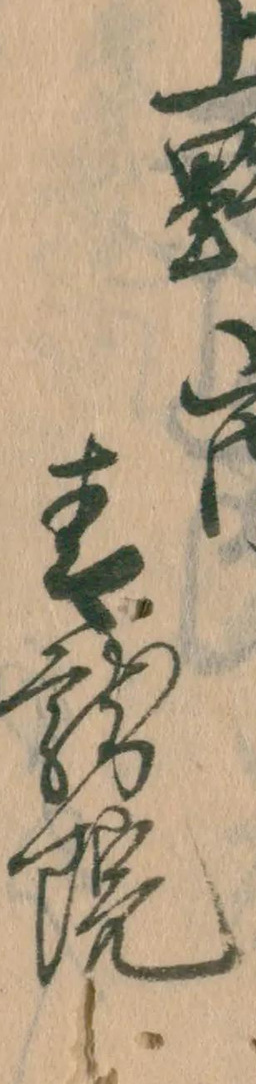青龍院
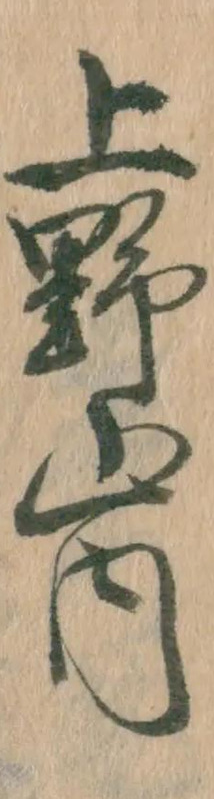上野山内
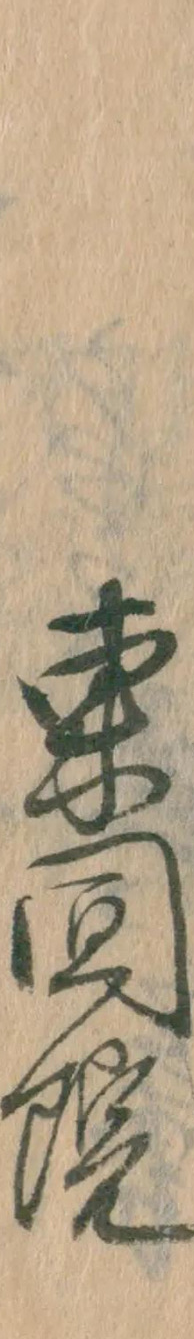東漸院
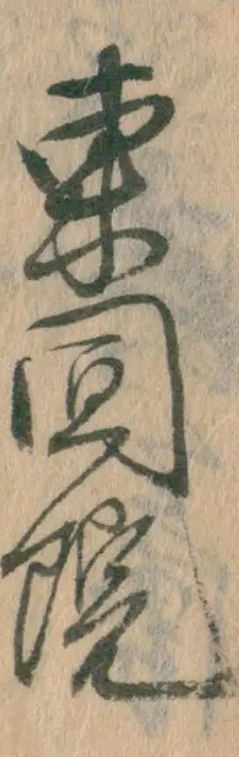東漸院
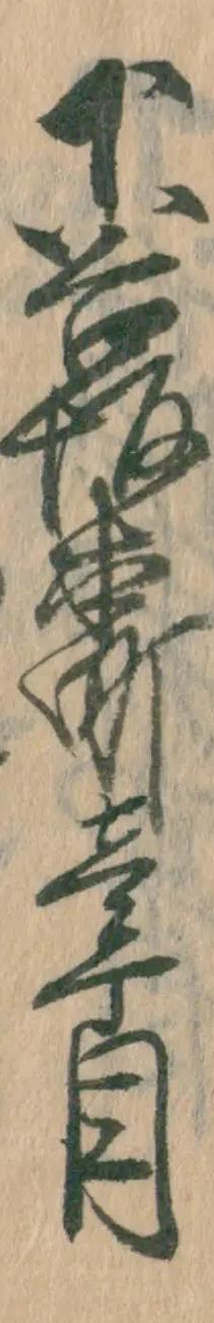右同断ニ付施し下谷坂本町壱丁目

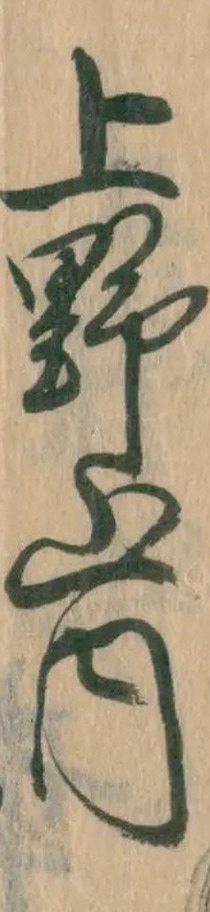上野山内
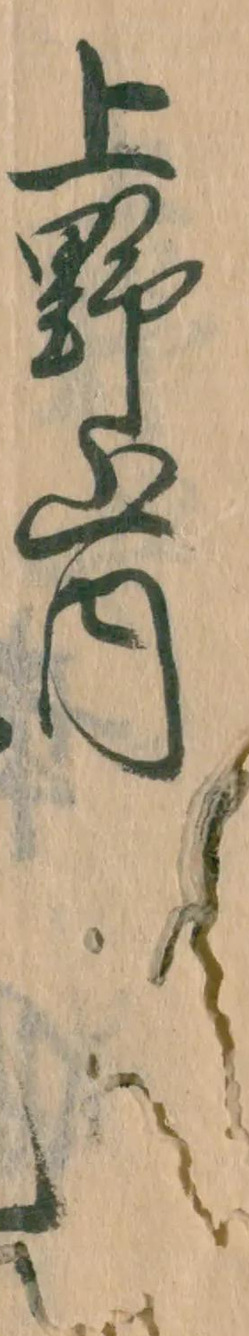上野山内
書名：武家方并寺院等ニテ施差出候一件
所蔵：国立国会図書館 National Diet Library, JAPAN
